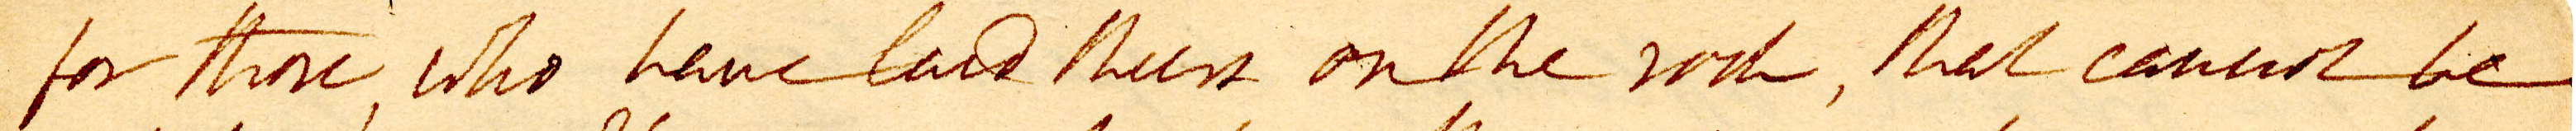for those who have laid theirs on the rout, that cannot be
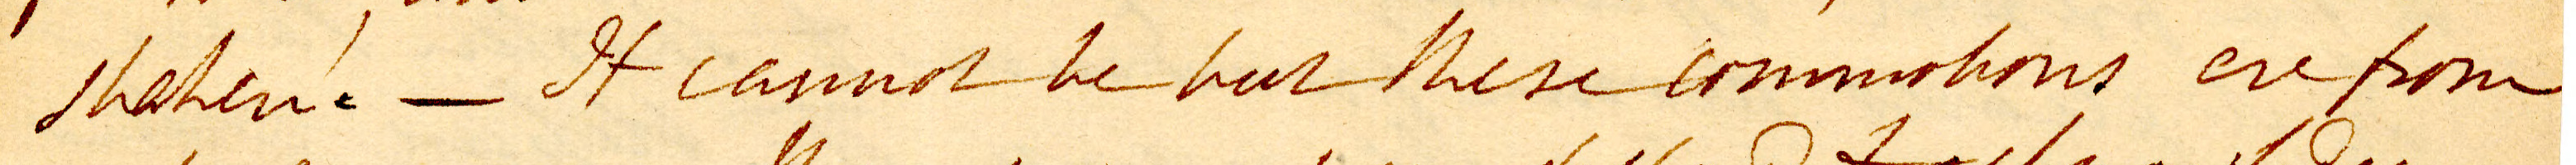shaken!- It cannot be but these commotions are from
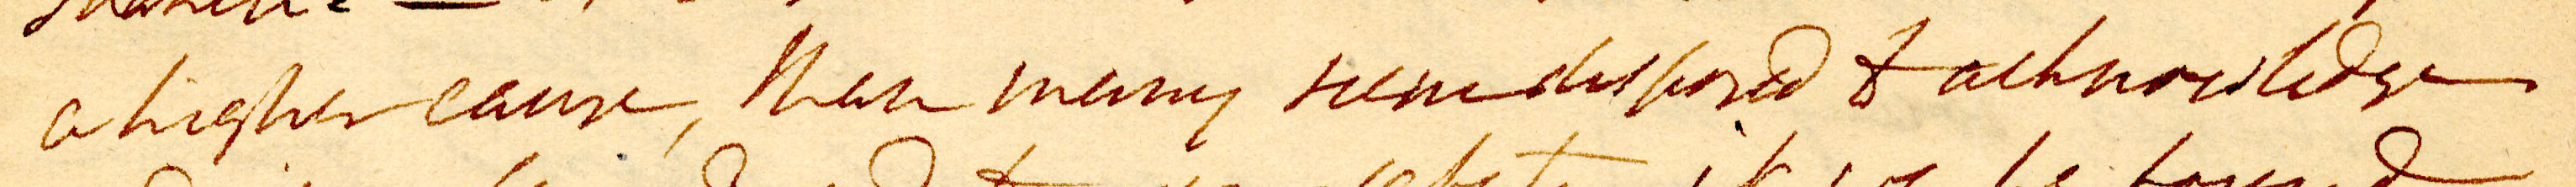a higher cause, than many seem disposed to acknowledge
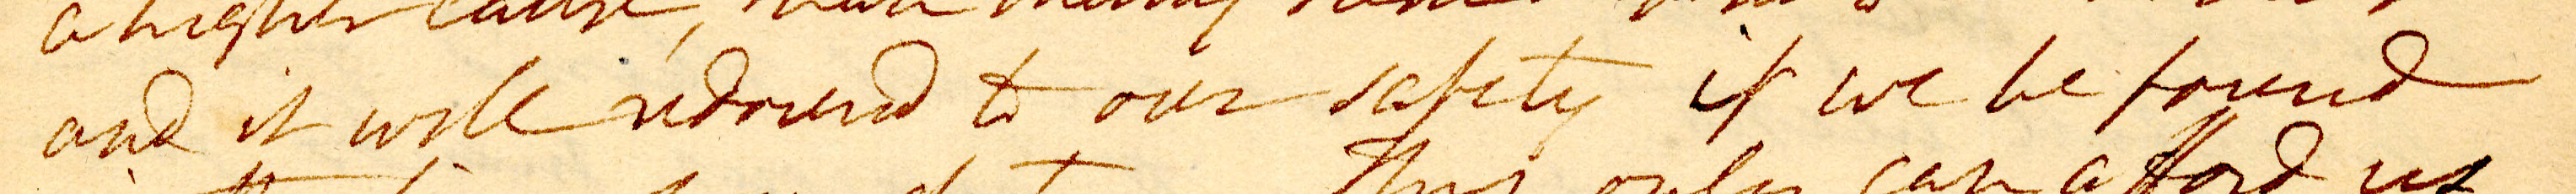and it will redound to our safety if we be found
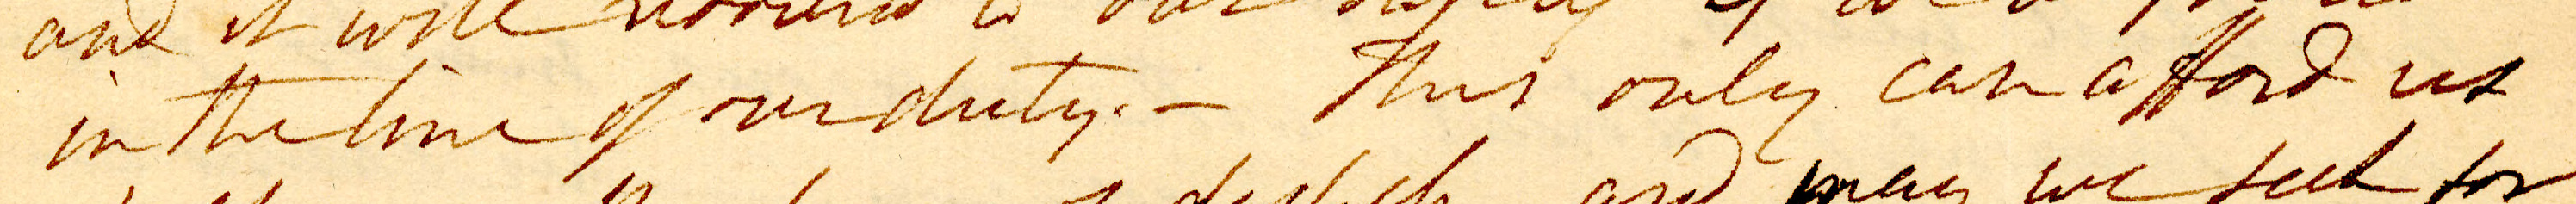in the time of our duty.- This only can afford us
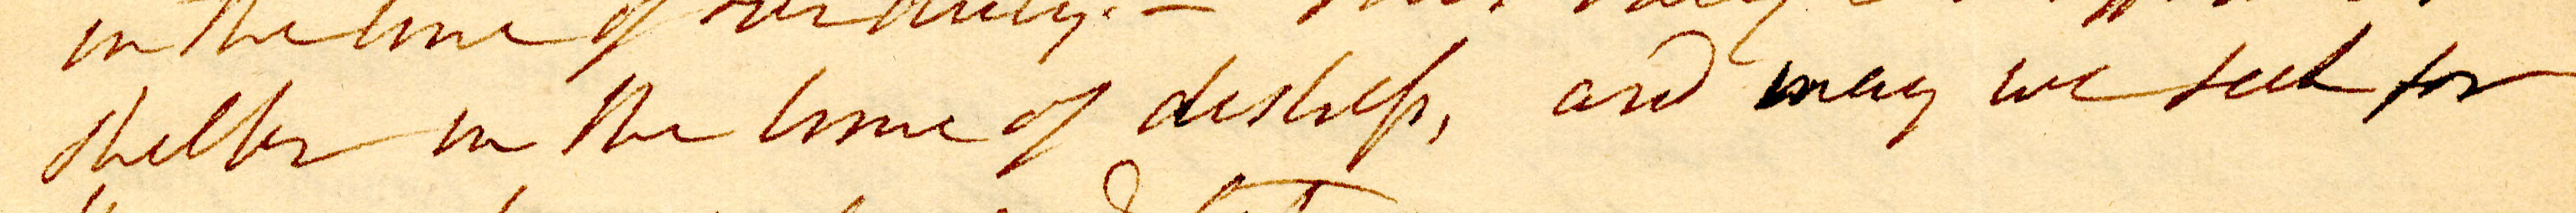shelter in the time of distress, and we may feel for
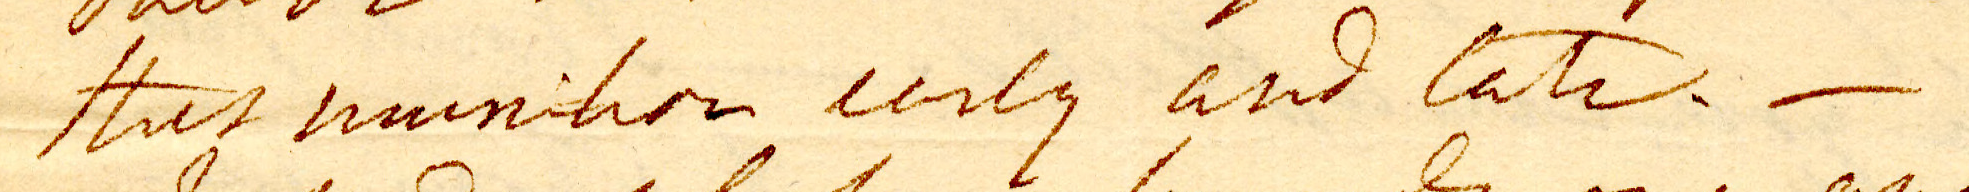this number early and late.-
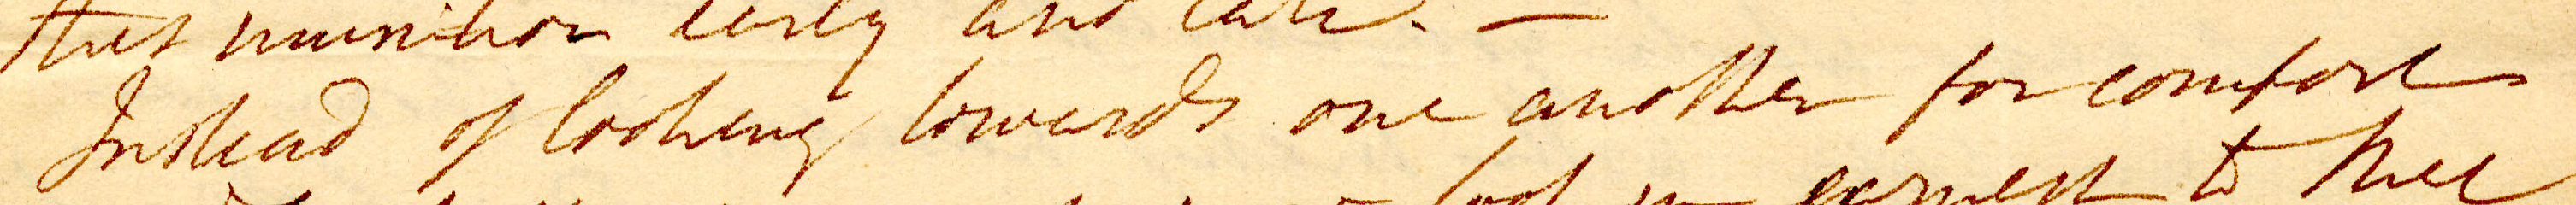Instead of looking towards one another for comfort
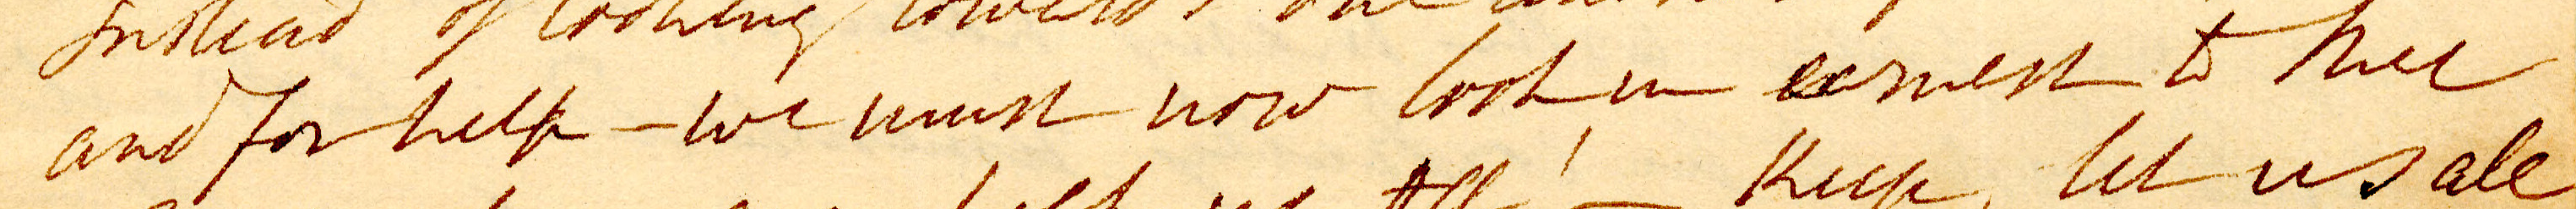and for help- we must now look in earnest to him
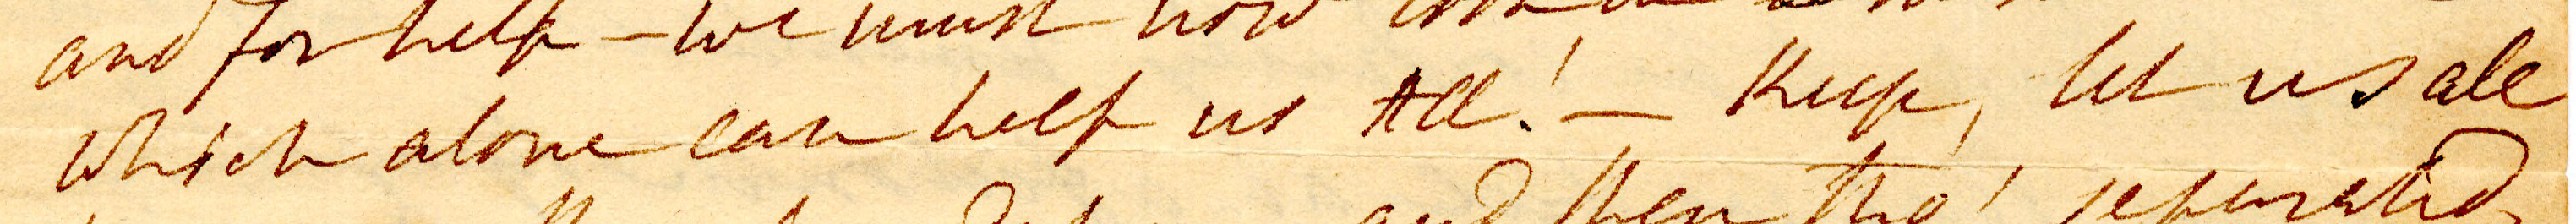which alone can help us All!- Keep, let us all
